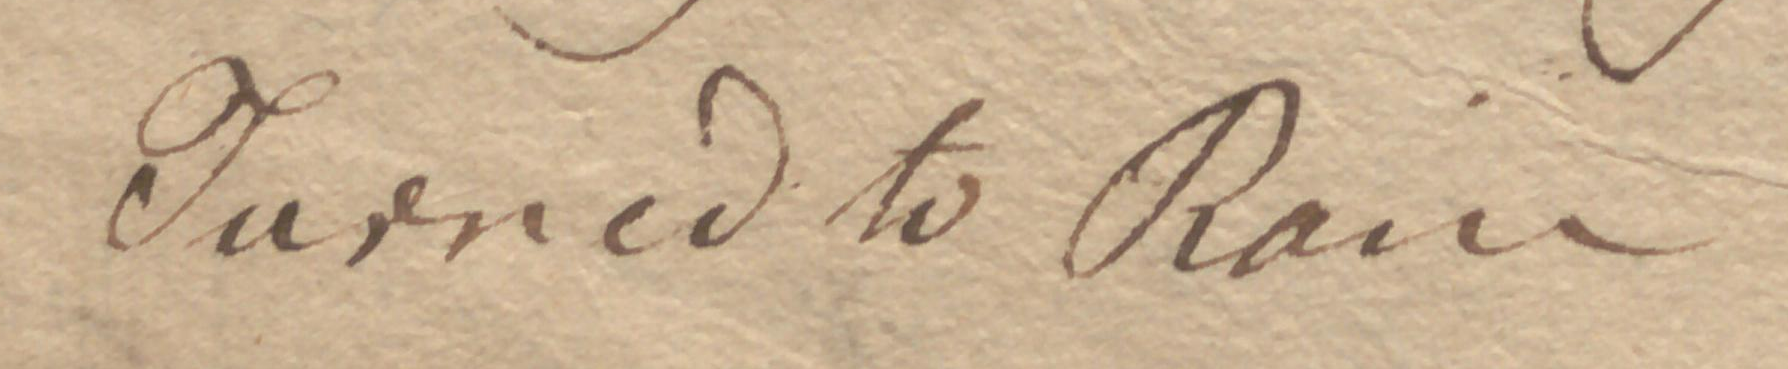Turned to Rain
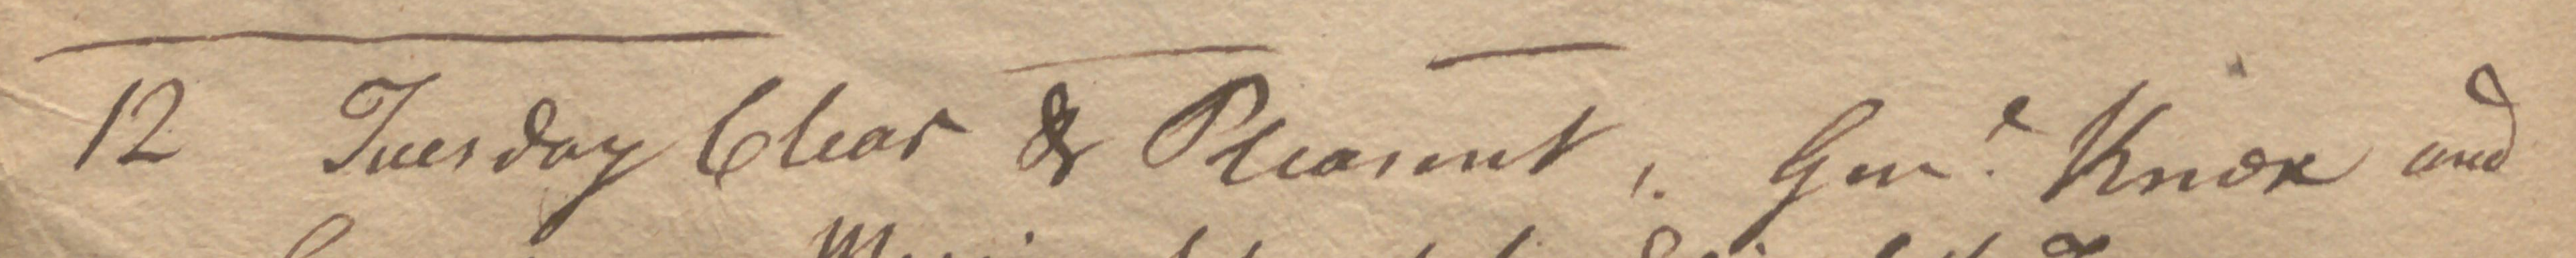12 Tuesday Clear & Pleasent, Gen^l. Knox and
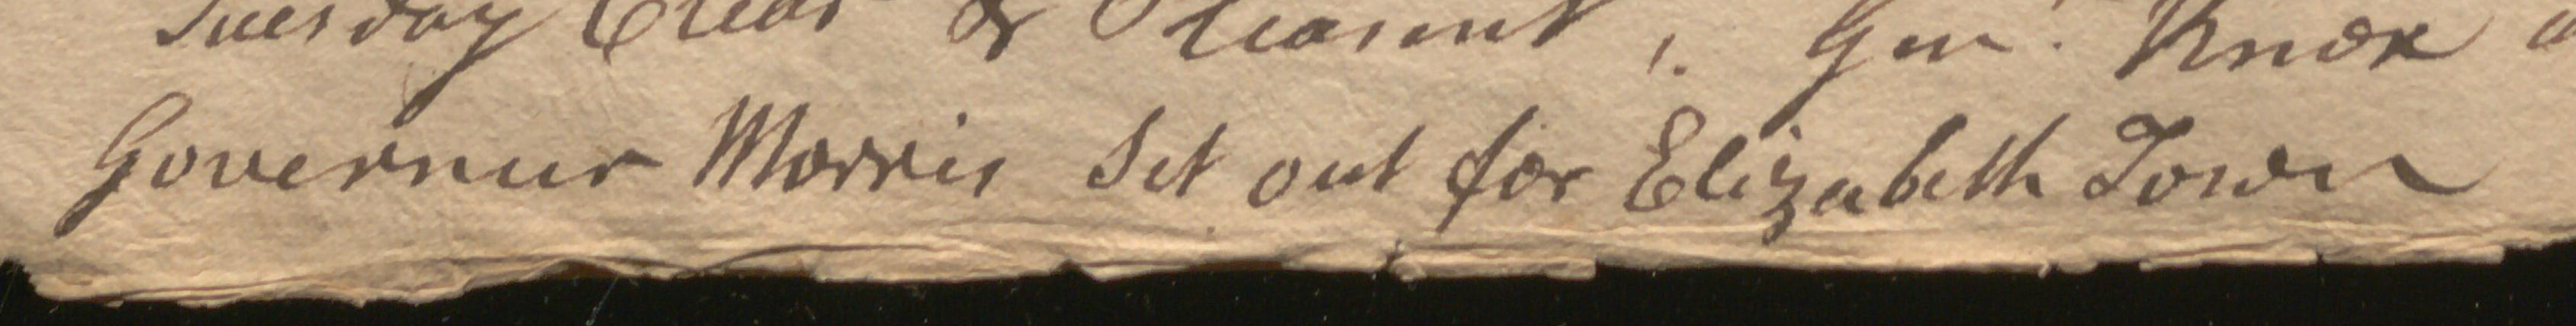Governur Morris set out for Elizabeth Town
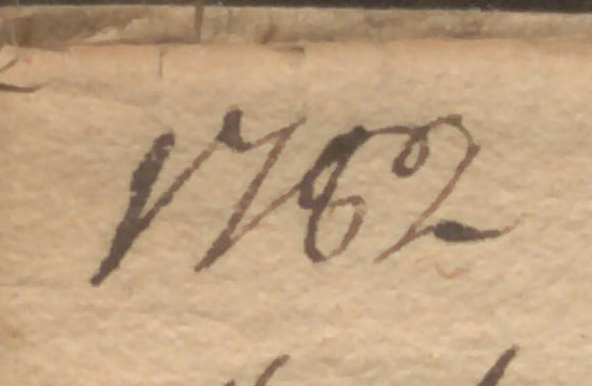1782
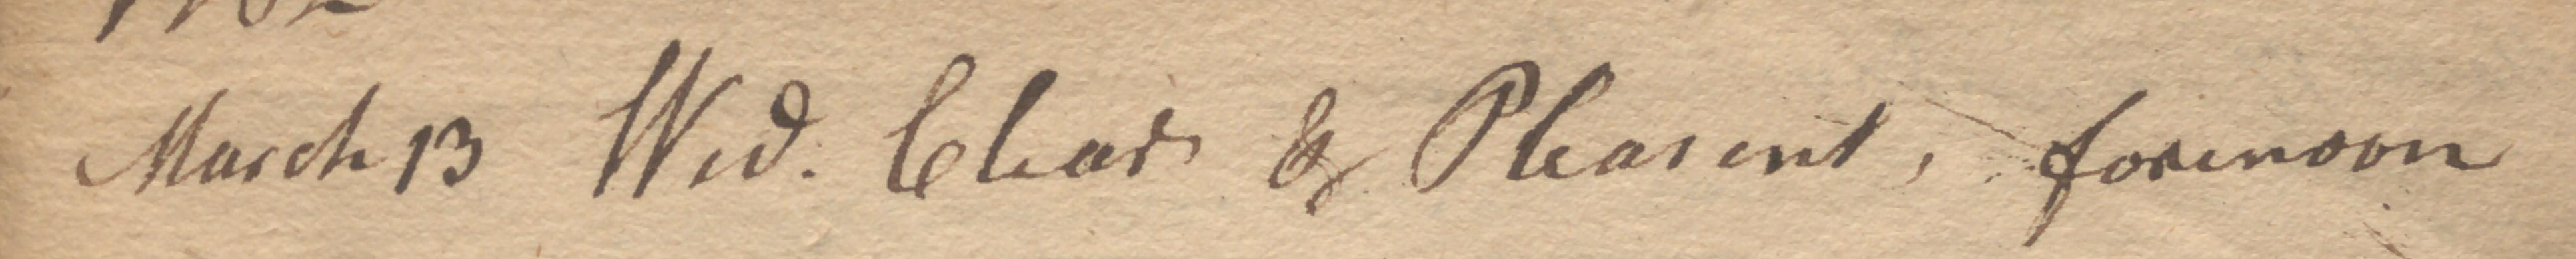March 13 Wed. Clear & Pleasent, forenoon
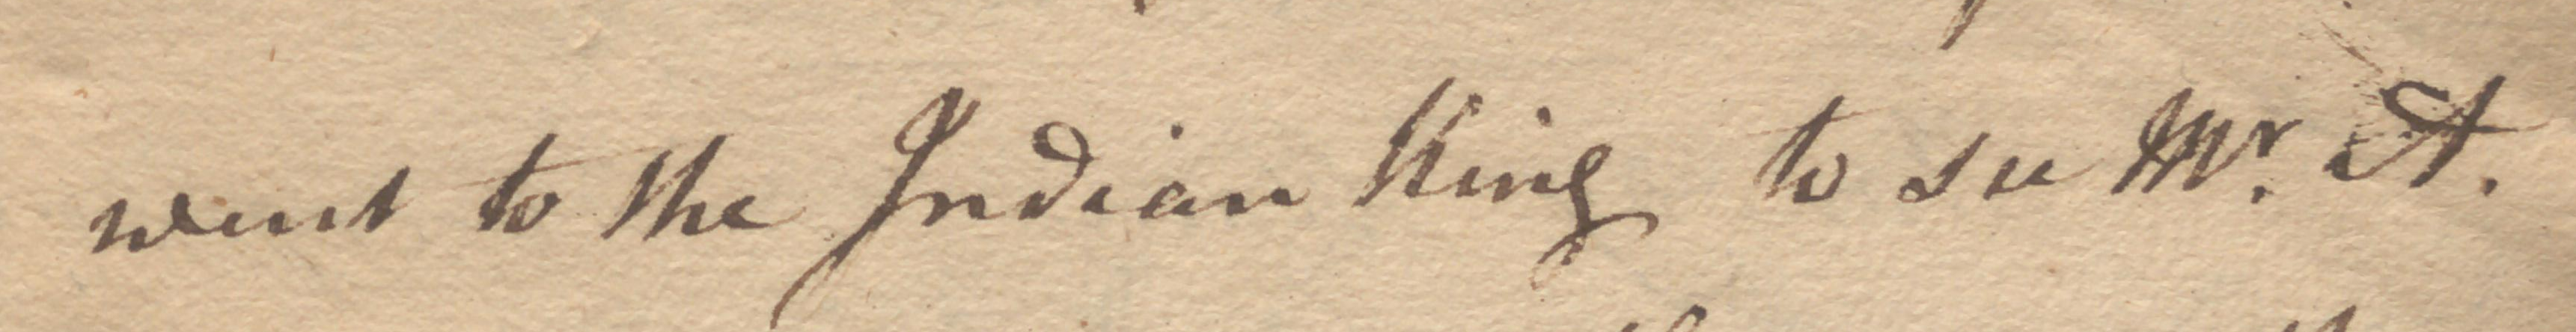went to the Indian King to see M^r. A.
